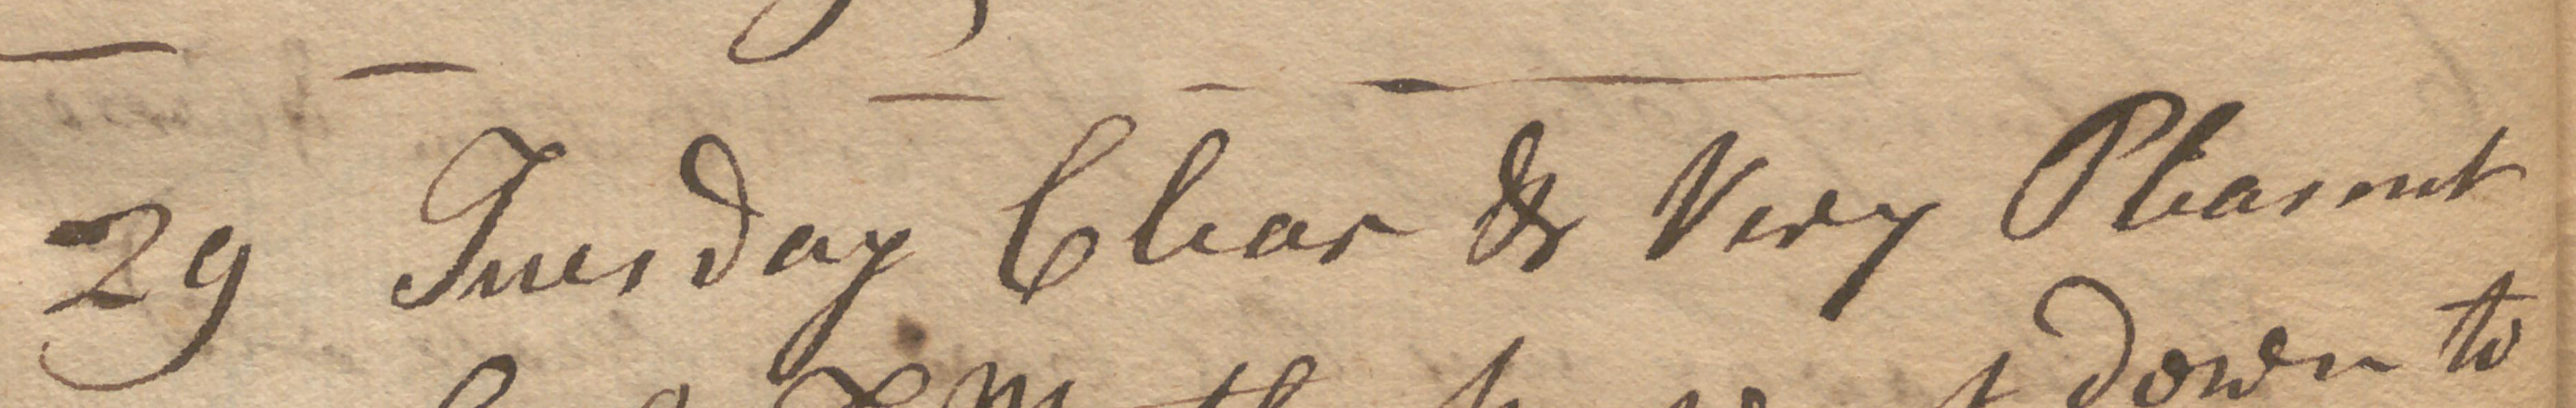29 Tuesday Clear & Very Pleasent
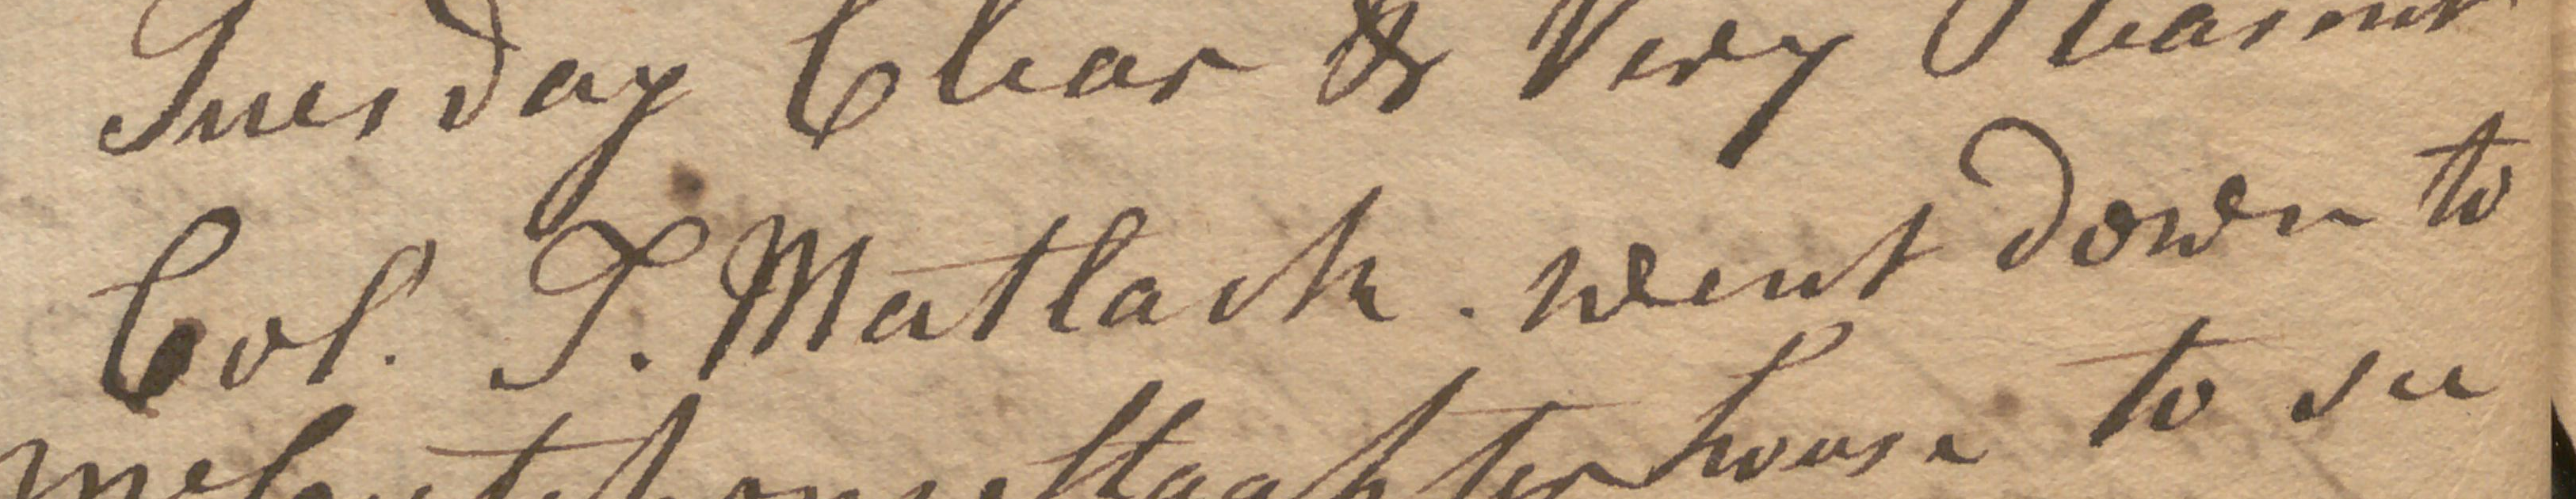Col. T. Matlack went down to
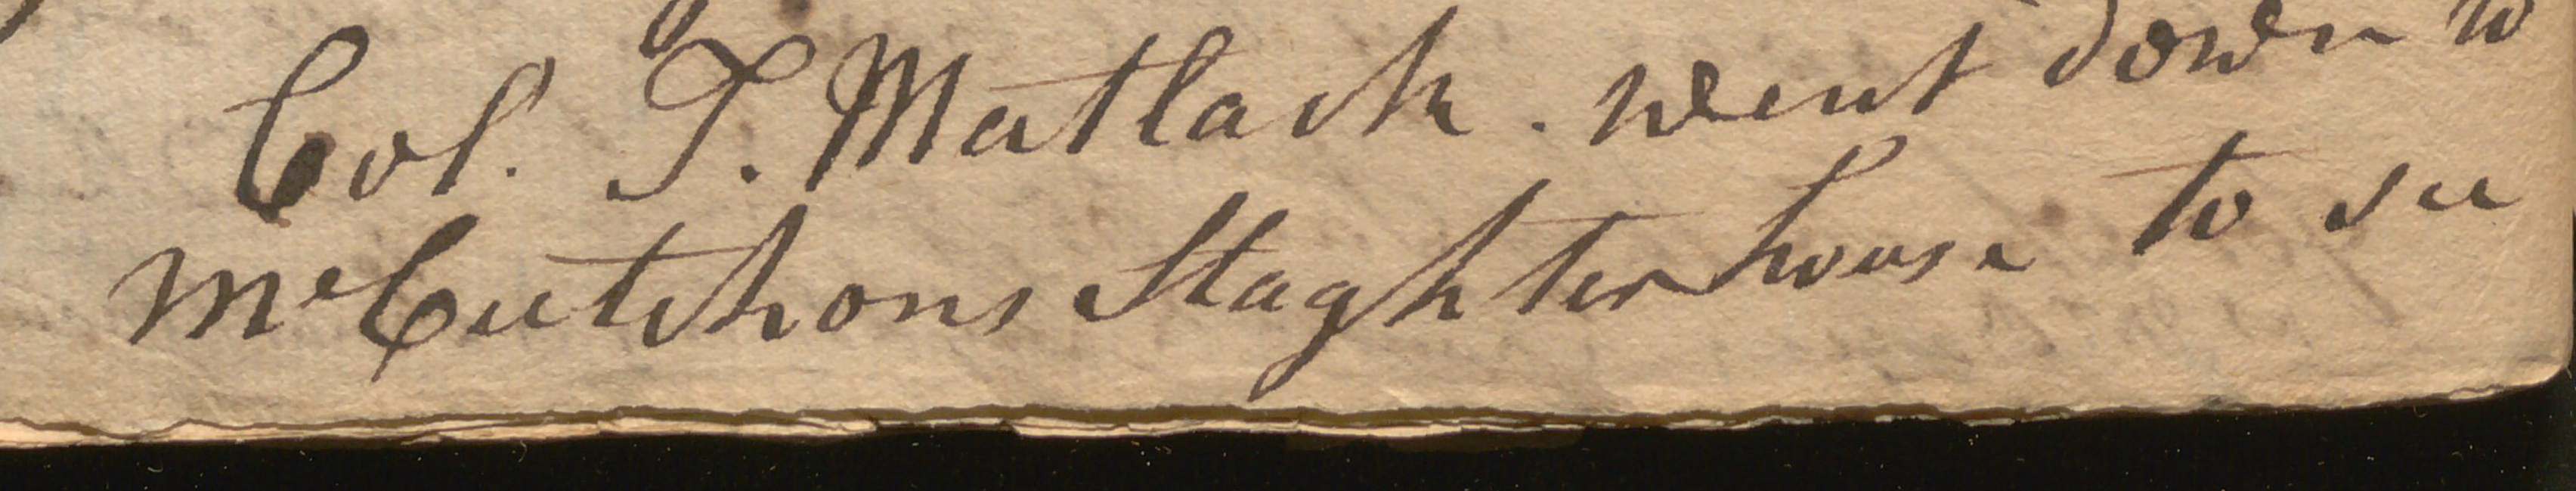M^o Cutchons Staghterhouse to see
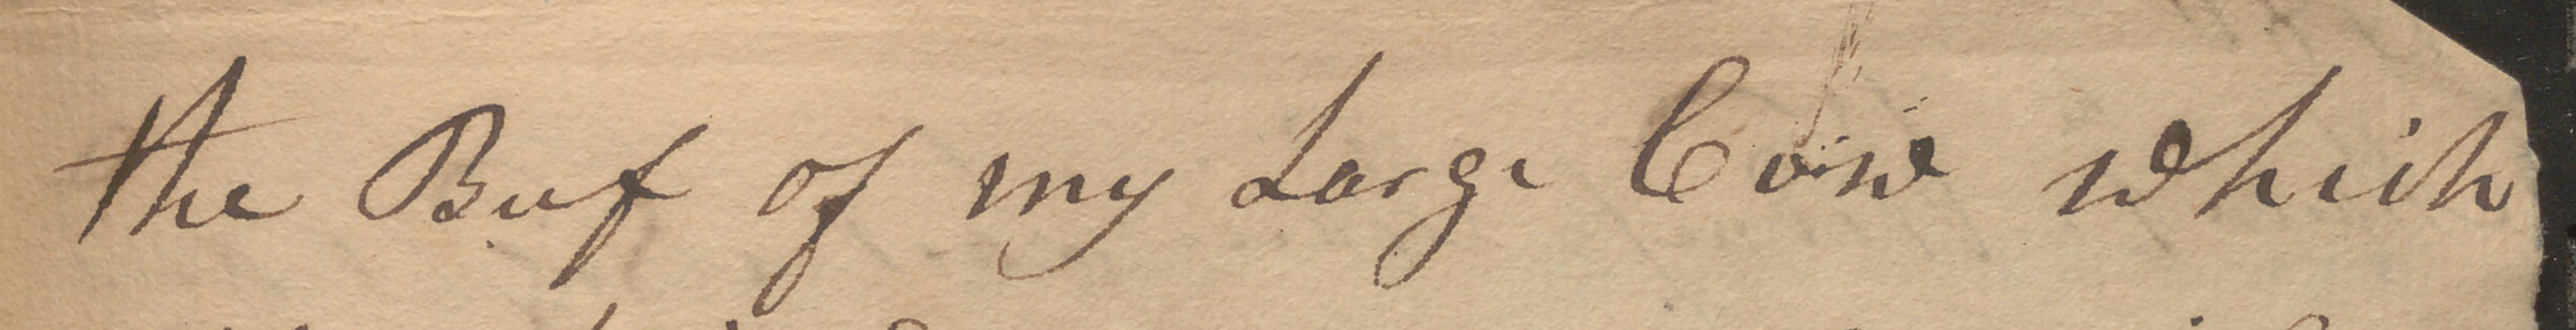the Beef of my Large Cow which
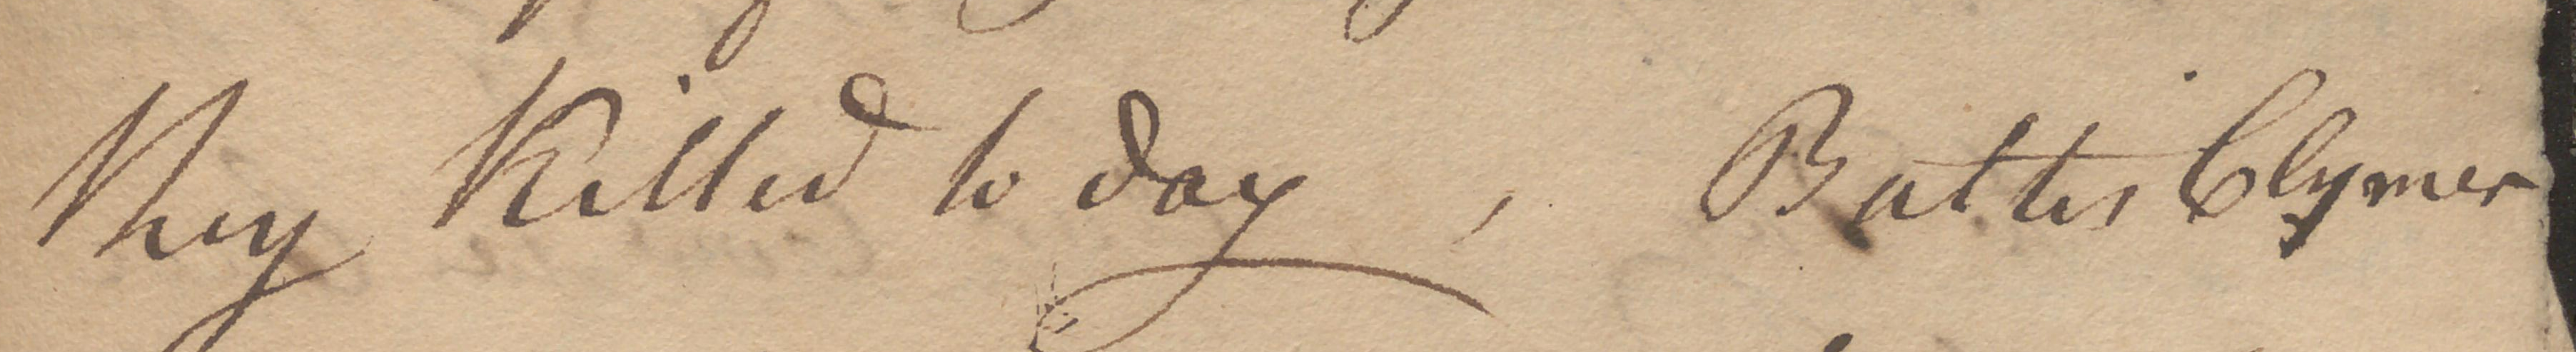they Killed to day. Baltes Elymes
